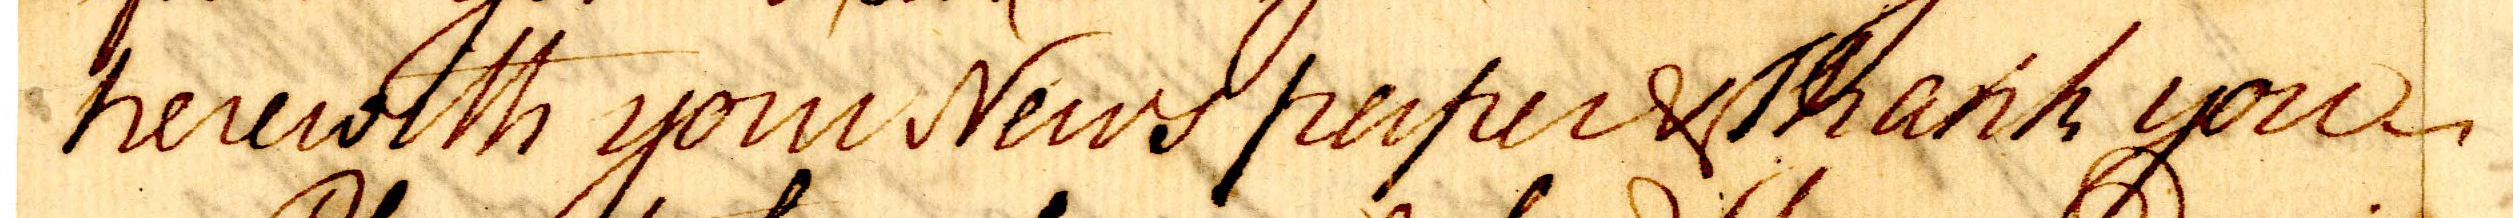herewith your News paper & thank you-
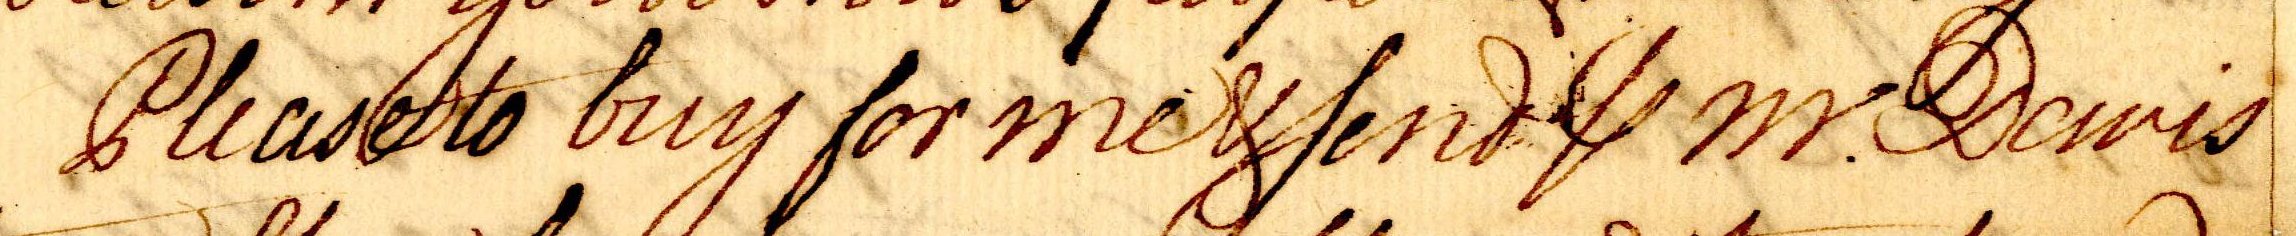Please to buy for me & Send per M^r. Davis
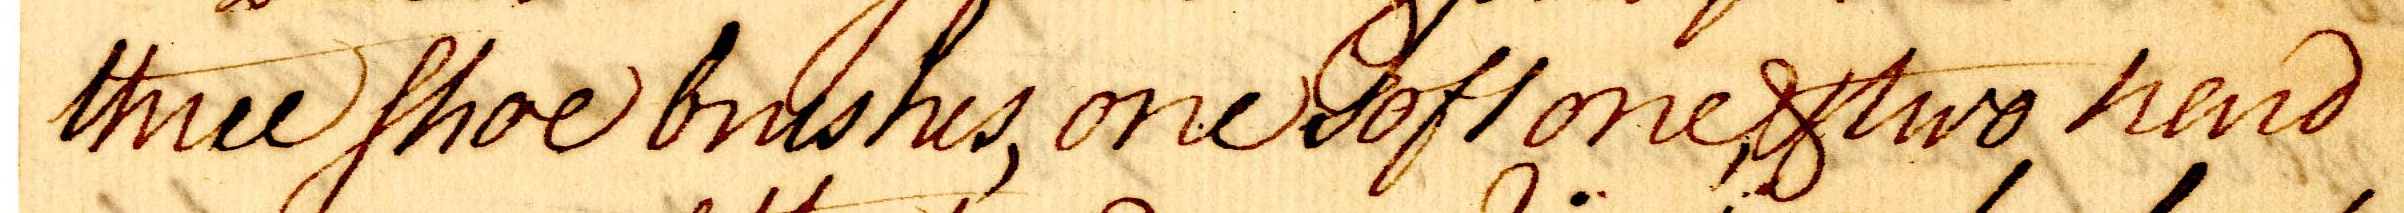three Shoe brushes, one soft one & two hard
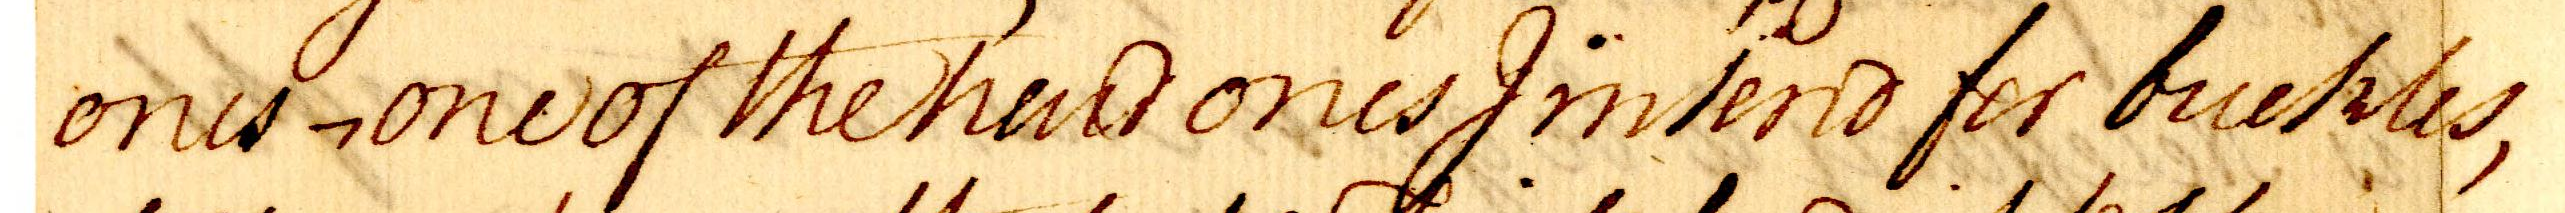ones- one of the hard ones I intend for buckles,
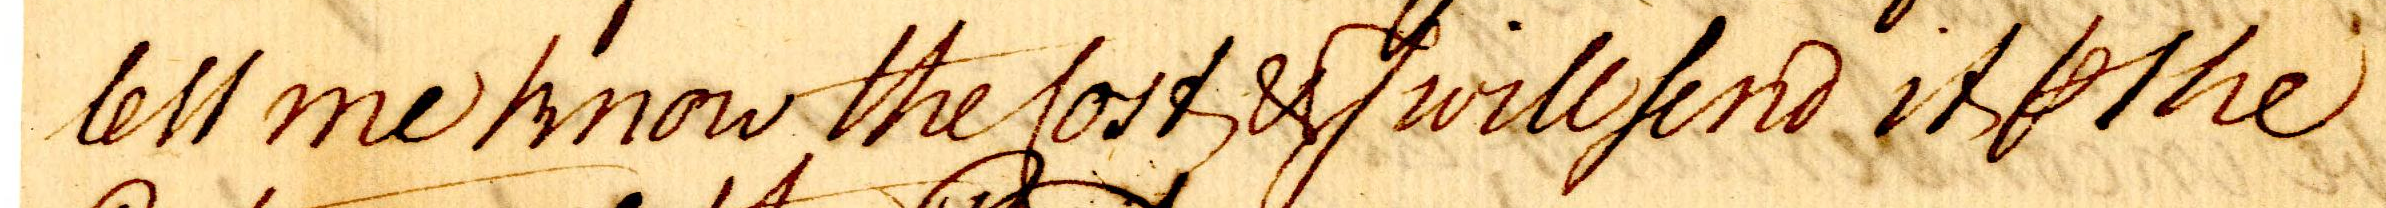tell me know the Cost & I will send it per the
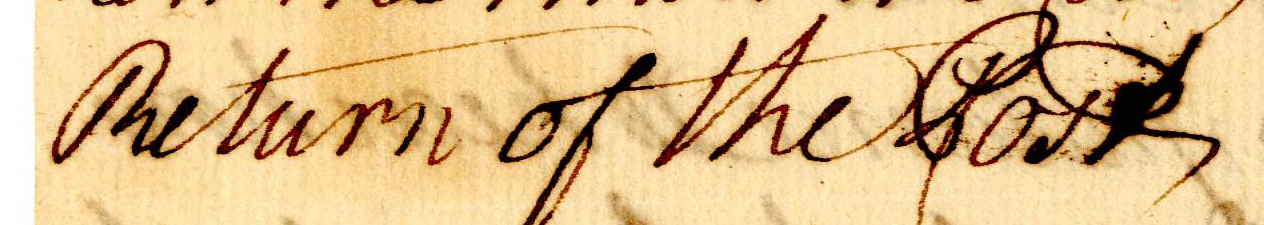Return of the Post
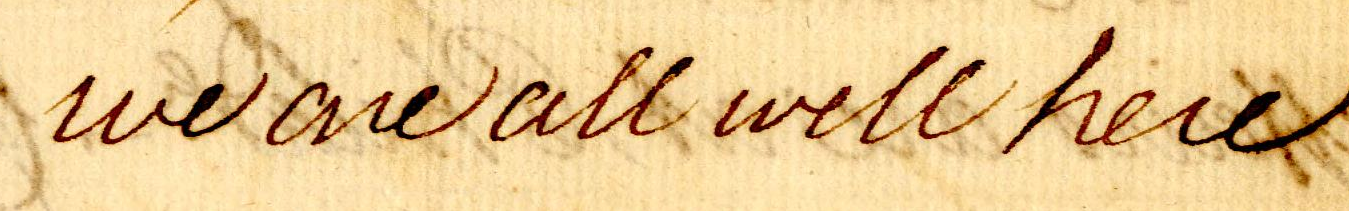we are all well here
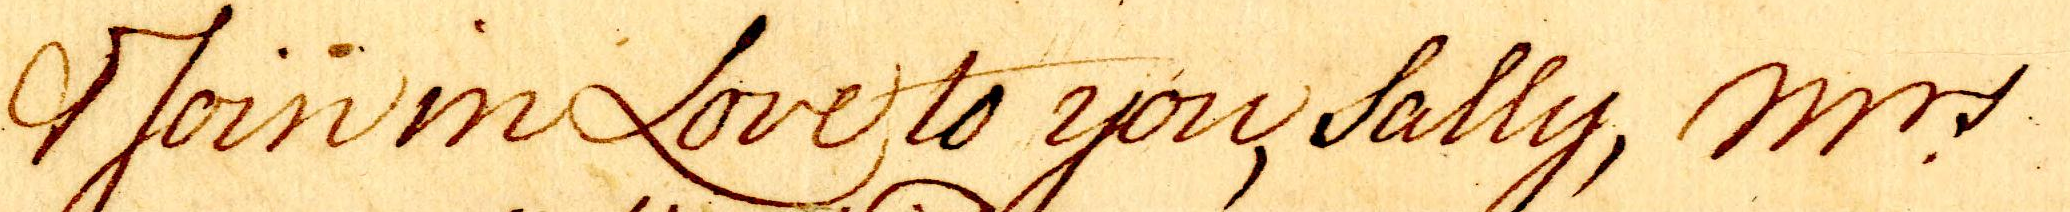join in Love to you, Sally, M^rs
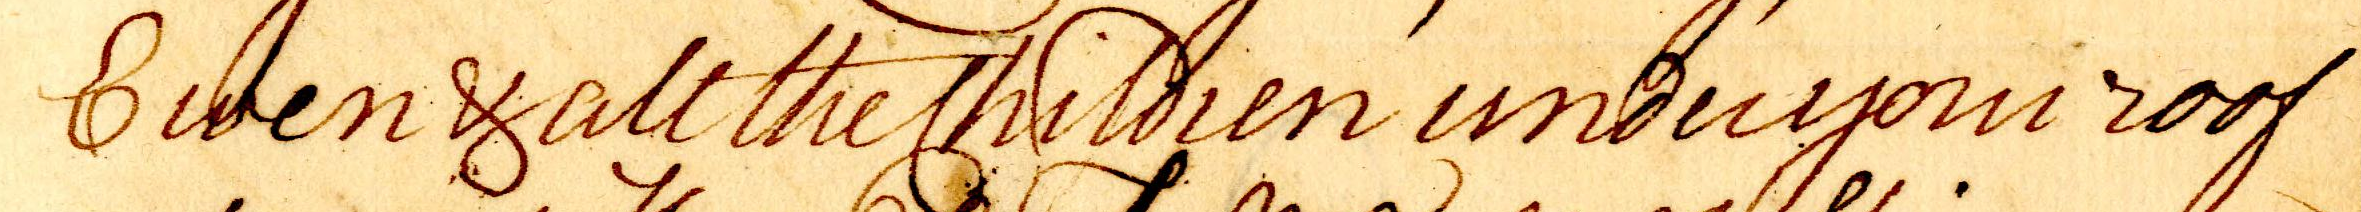Ewen & all the Children under your roof
